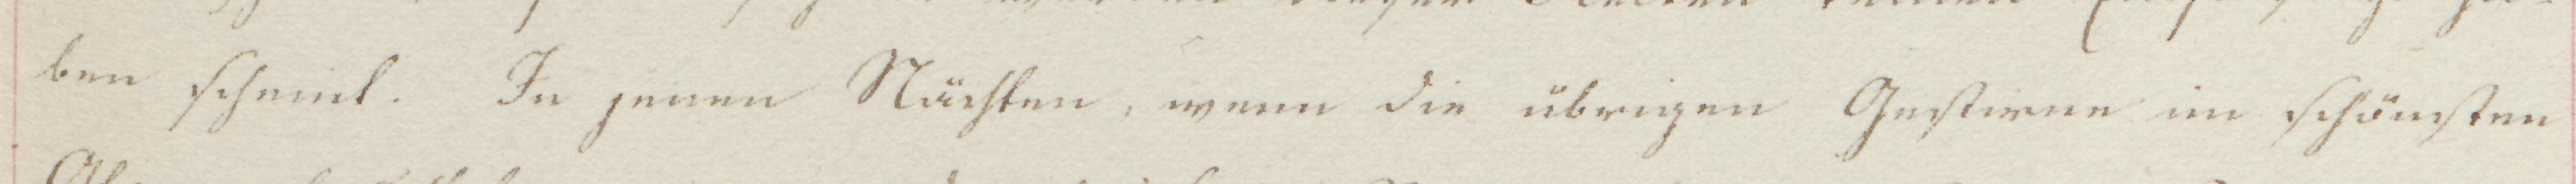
ben scheint. In jenen Nächten, wenn die übrigen Gestirne im schönsten
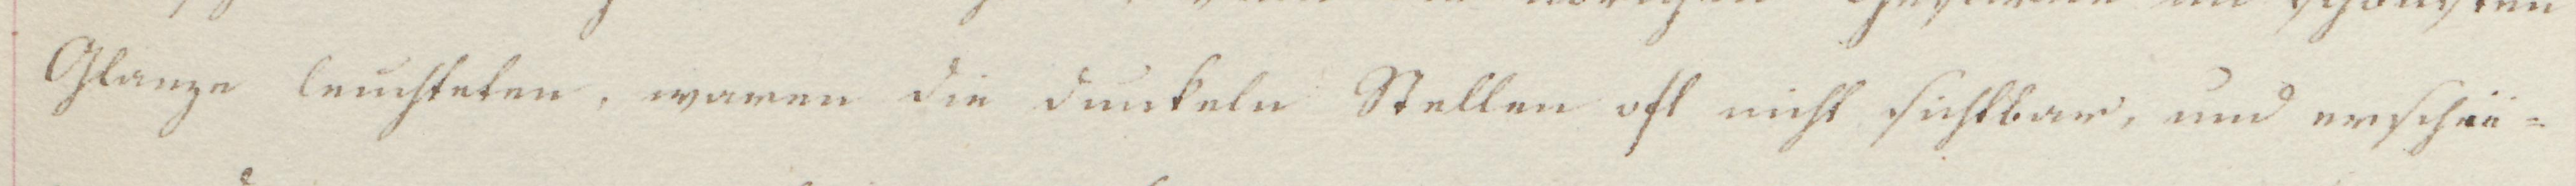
Glanze leuchten, waren die dunkeln Stellen oft nicht sichtbar, und erschie-
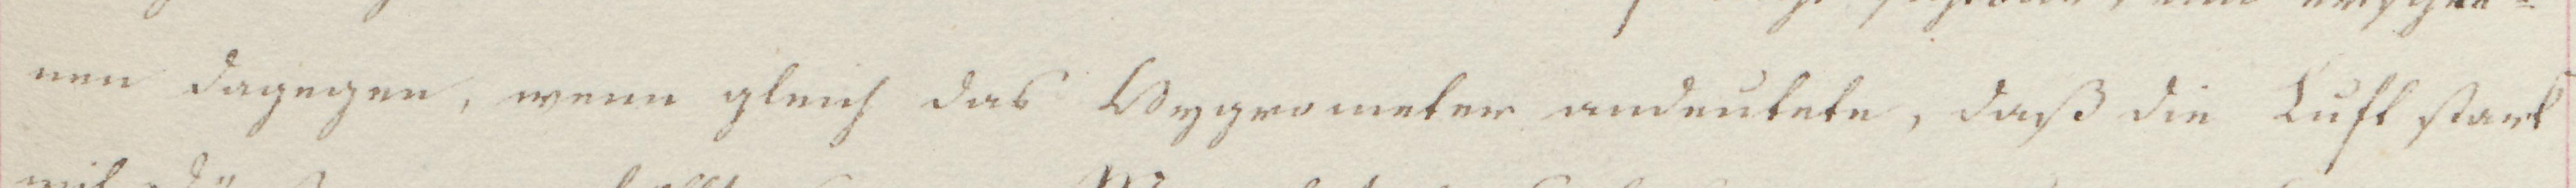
nen dagegen, wenn gleich das Hygrometer andeutete, daß die Luft stark
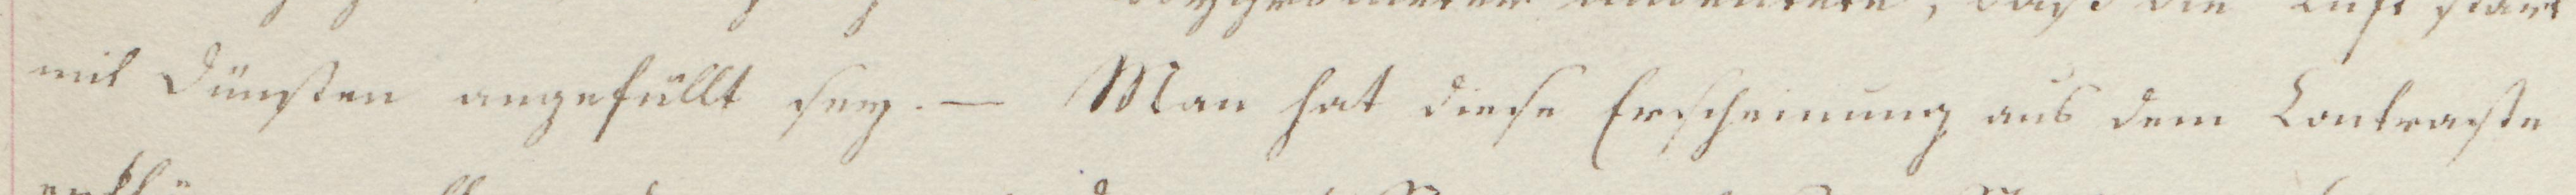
mit Dünsten angefüllt sey. – Man hat diese Erscheinung aus dem Contraste
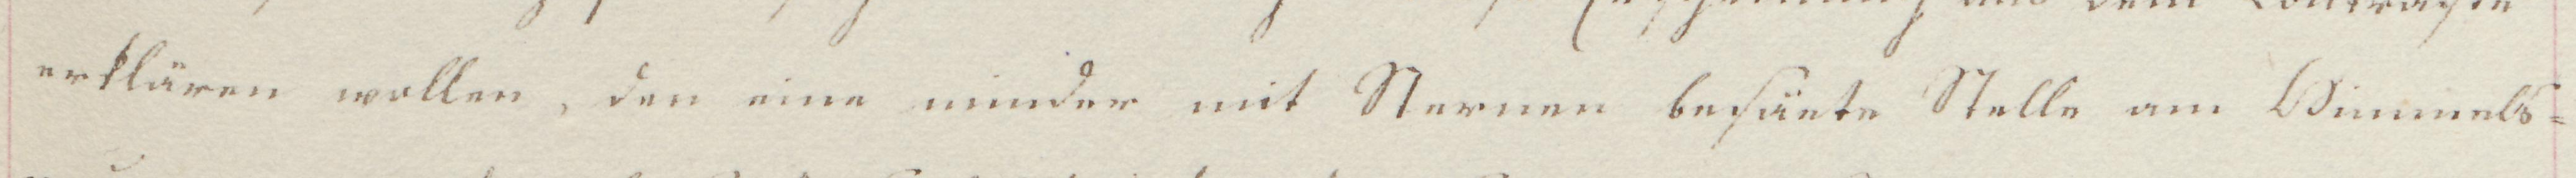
erklären wollen, den eine minder mit Sternen besäete Stelle am Himmels-
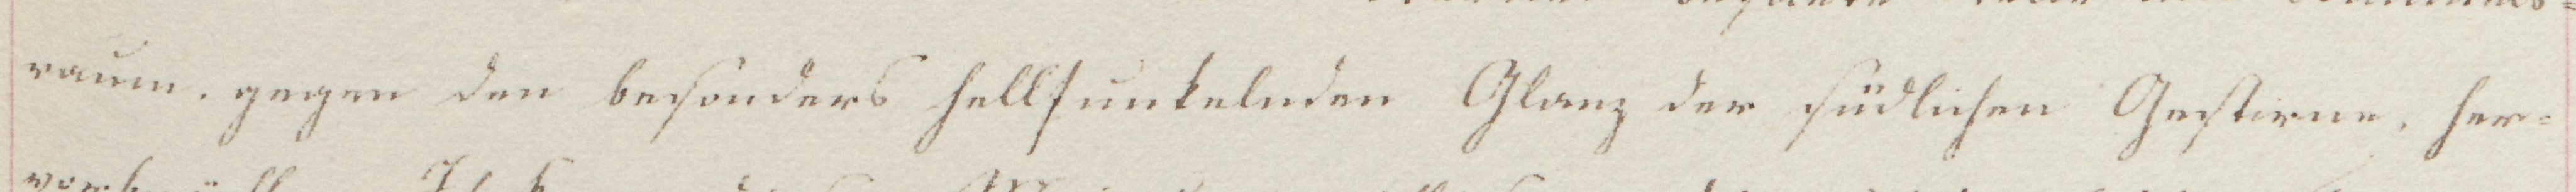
raum, gegen den besonders hellfunkelnden Glanz der südlichen Gestirne, her-
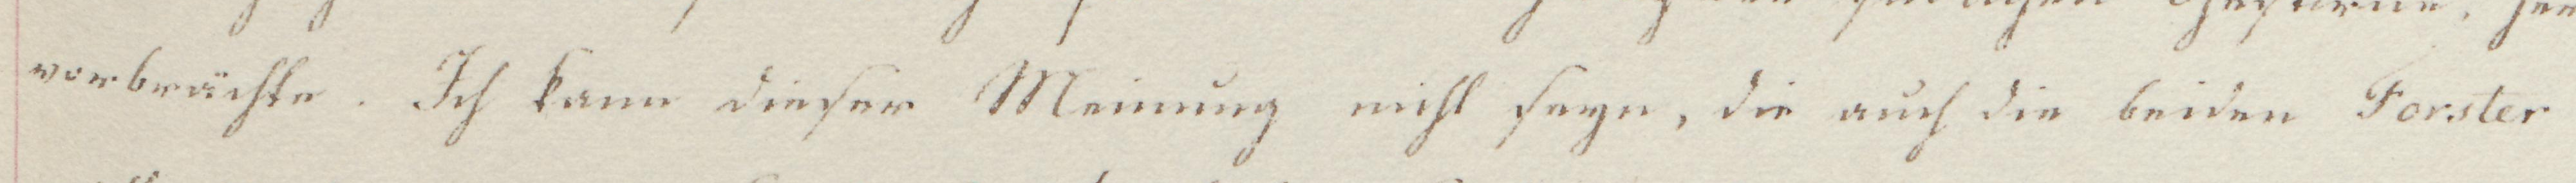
vorbrächte. Ich kann dieser Meinung nicht seyn, die auch die beiden Forster
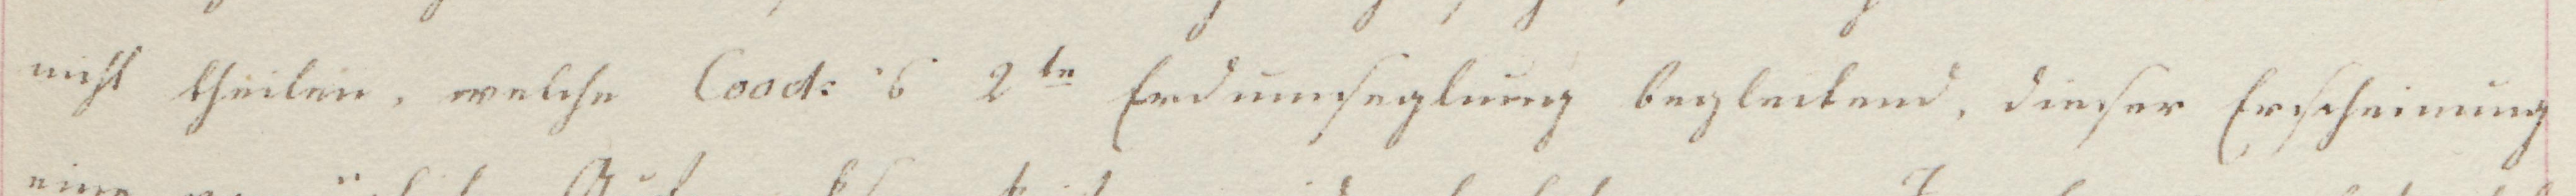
nicht theilen, welche Coock's 2te Erdumseglung begleitend, dieser Erscheinung
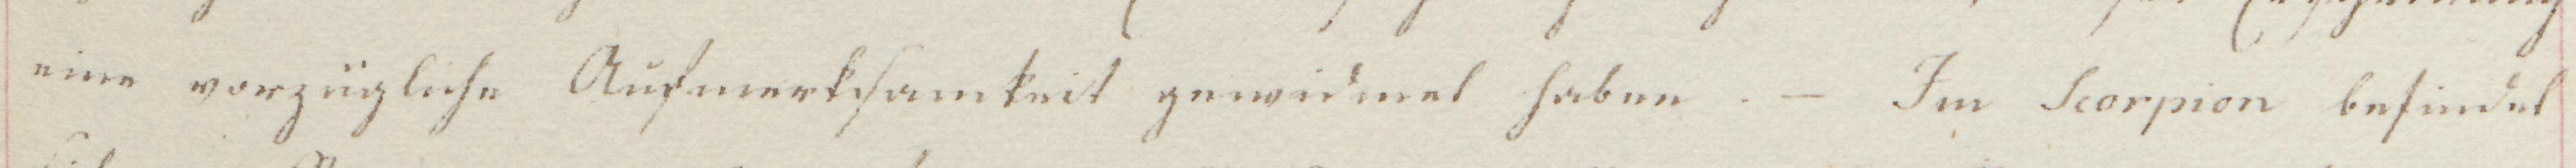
eine vorzügliche Aufmerksamkeit gewidmet haben. – Im Scorpion befindet
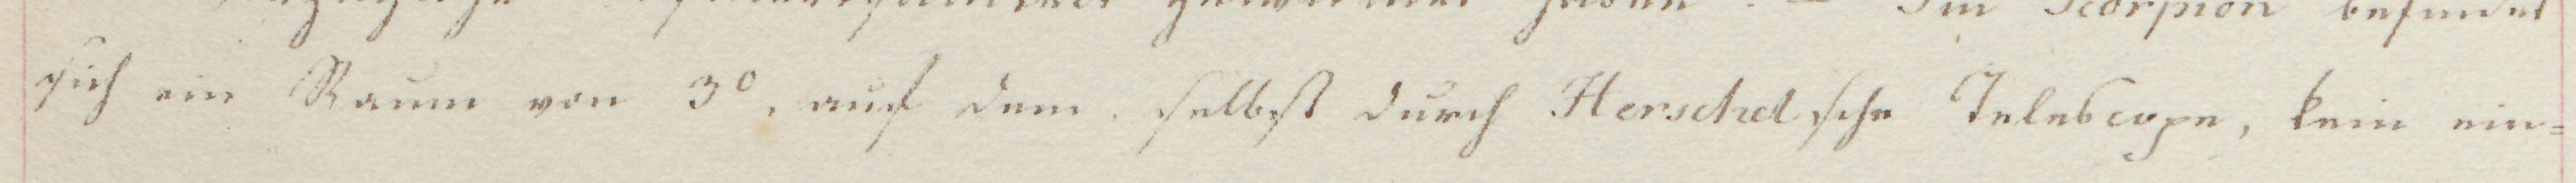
sich ein Raum von 3°, auf dem, selbst durch Herschelsche Telescope, kein ein-
